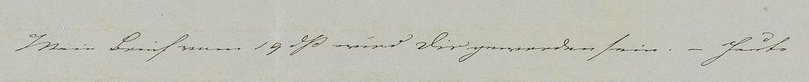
Mein Brief vom 19 dß wird dir geworden sein. – Heute
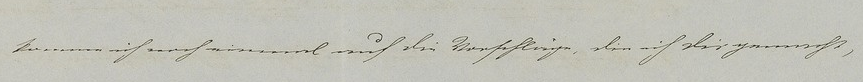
komme ich noch einmal auf die Vorschläge, die ich dir gemacht,
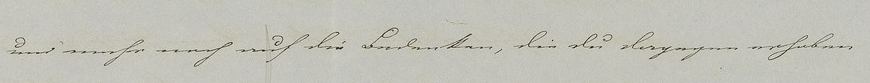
und mehr noch auf die Bedenken, die du dagegen erhoben
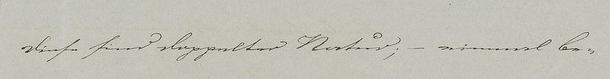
Diese sind doppelter Natur; – einmal be-
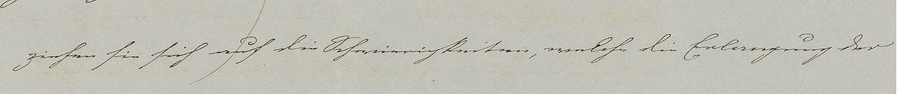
ziehen sie sich auf die Schwierigkeiten, welche die Erlangung der
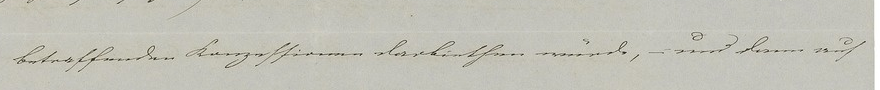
betreffenden Konzessionen darbiethen würde, – und dann auf
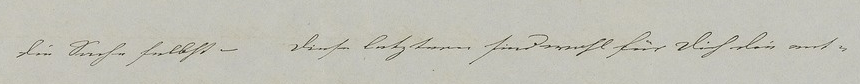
die Sache selbst. – Diese letztern sind wohl für dich die ent-
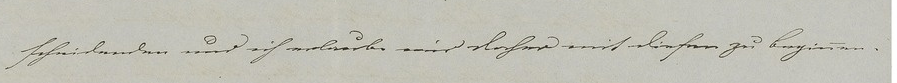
scheidenden und ich erlaube mir daher mit diesen zu beginnen.
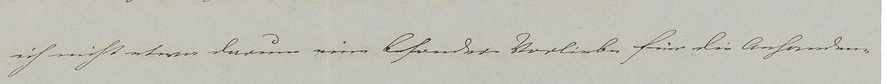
ich nicht etwa darum eine besondere Vorliebe für die Anhanden-
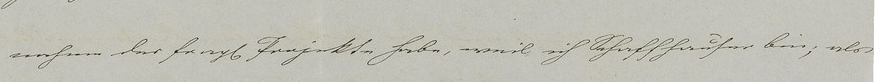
nahme der fragl. Projekte habe, weil ich Schaffhauser bin; als
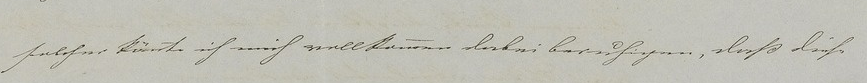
solcher könnte ich mich vollkommen dabei beruhigen, daß diese
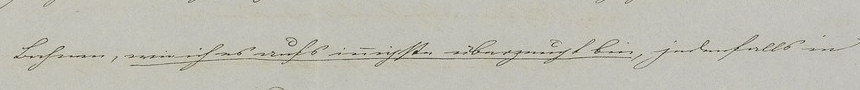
Bahnen, wie ich es aufs innigste überzeugt bin, jedenfalls in
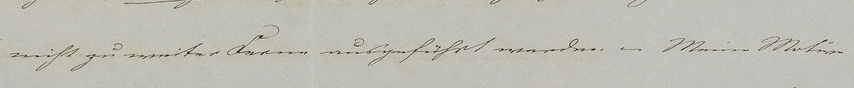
nicht zu weiter Ferne ausgeführt werden. – Meine Motive
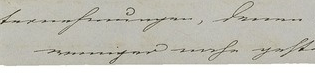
nahe gestellt worden bin.
